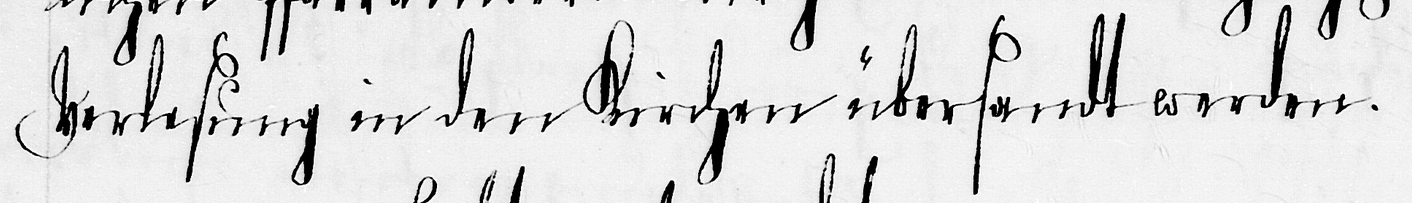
Verlesung in den Kirchen übersandt werden.
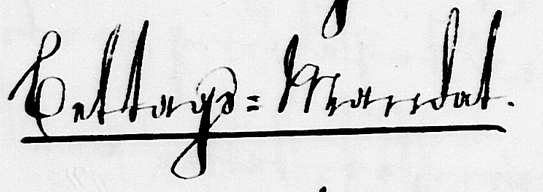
Bettags-Mandat.
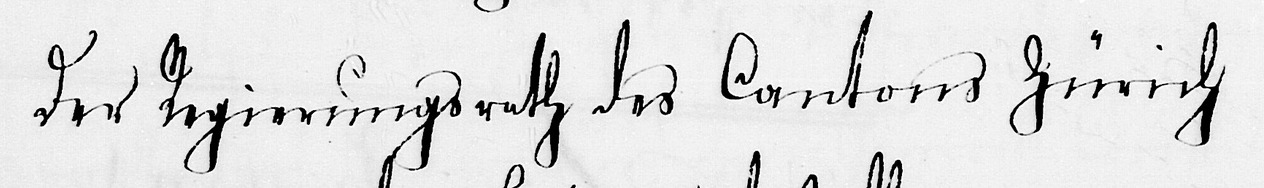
Der Regierungsrath des Cantons Zürich
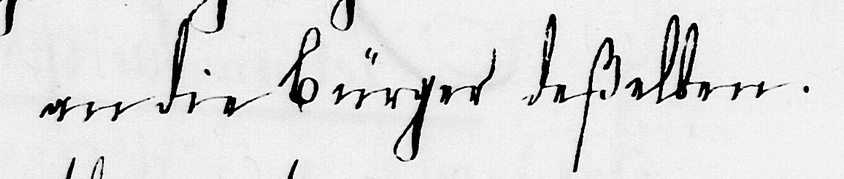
an die Bürger deßelben.
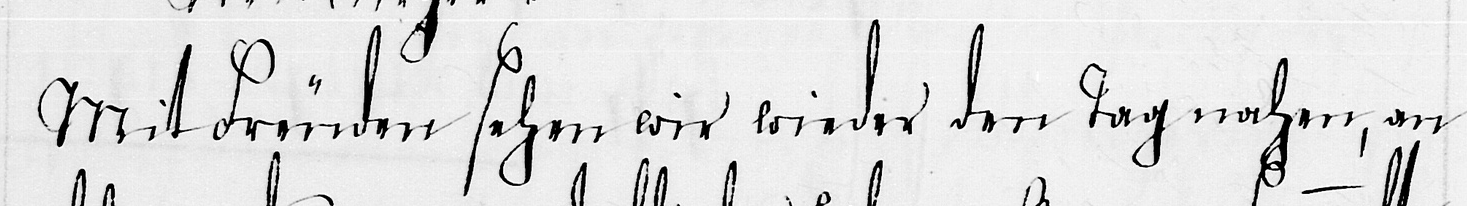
Mit Freuden sehen wir wieder den Tag nahen, an
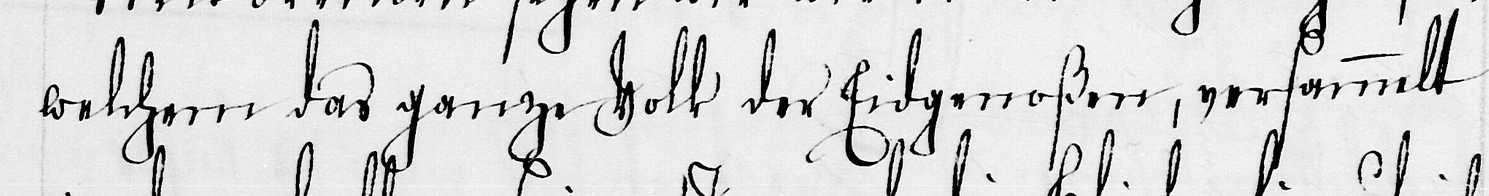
welchem das ganze Volk der Eidgenoßen, versammelt
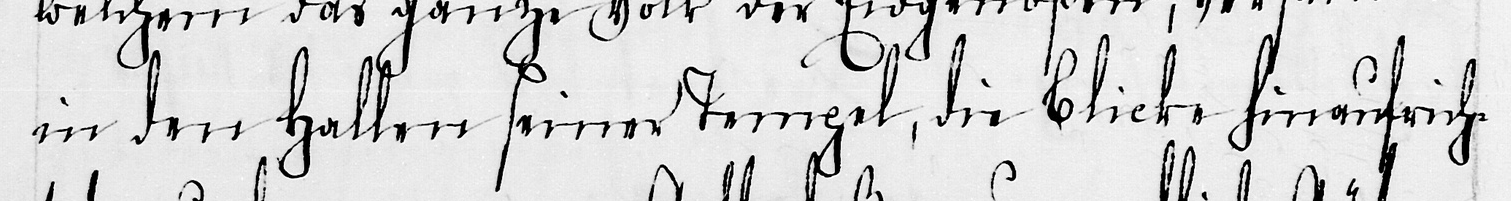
in den Hallen seiner Tempel, die Blicke hinaufrich¬
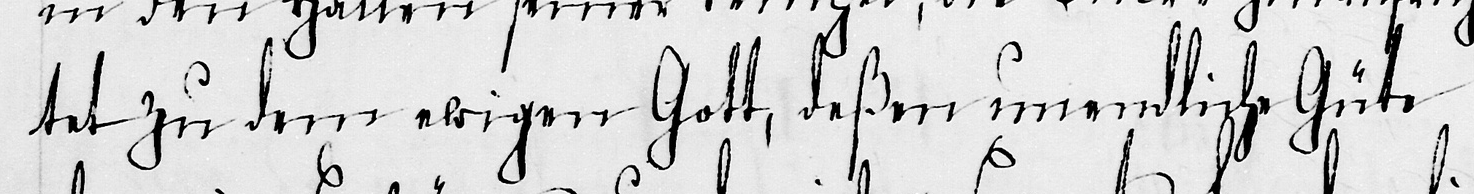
tet zu dem ewigen Gott, deßen unendliche Güte
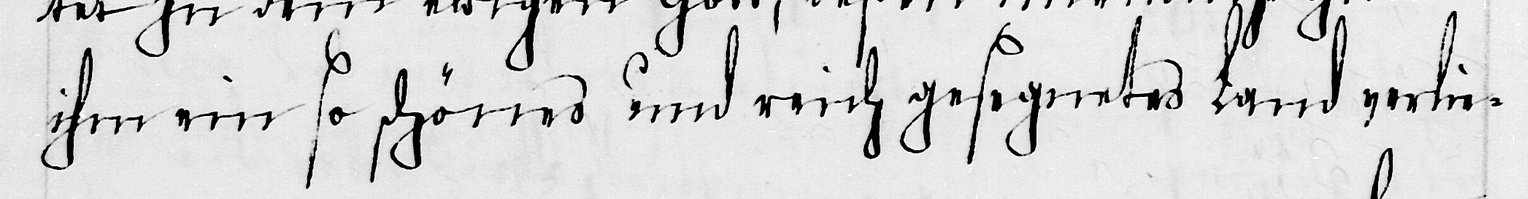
ihm ein so schönes und reich gesegnetes Land verlie-
